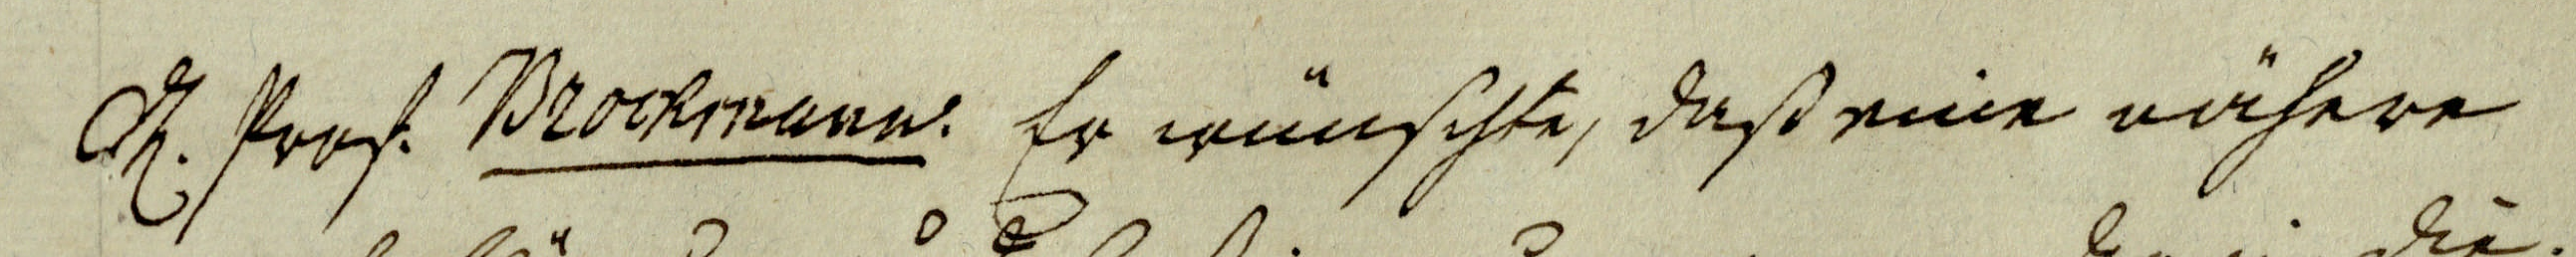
dh. Prof. Brockmann. Er wünschte, daß eine nähere
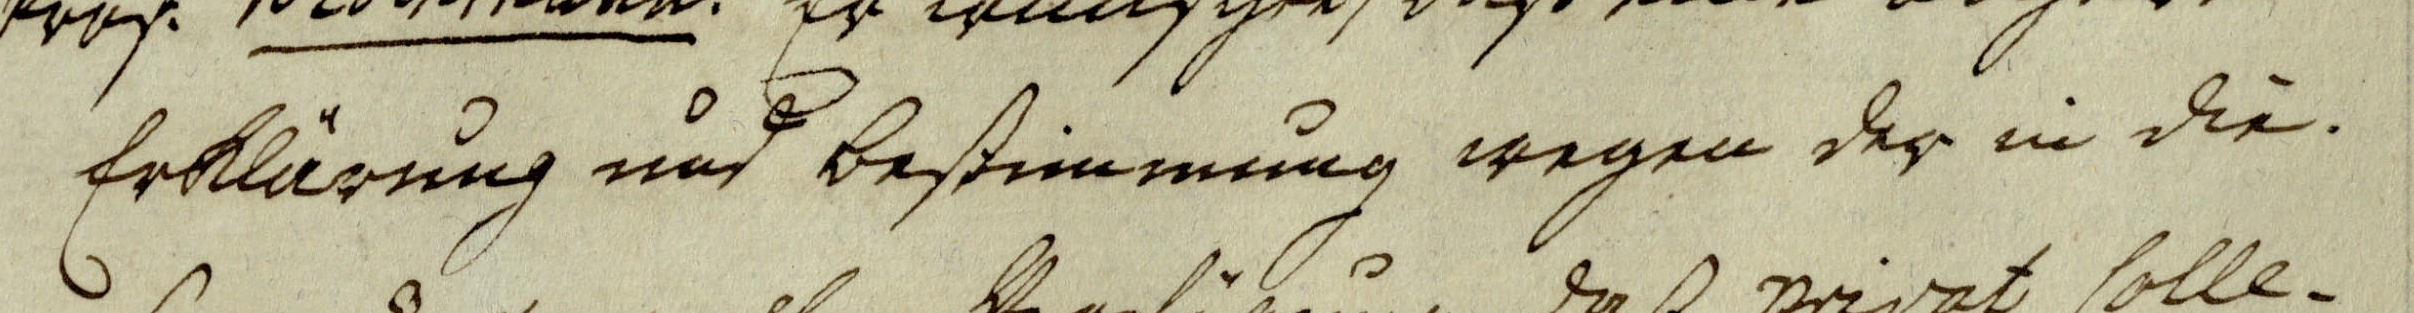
Erklärung und Bestimmung wegen der in die¬
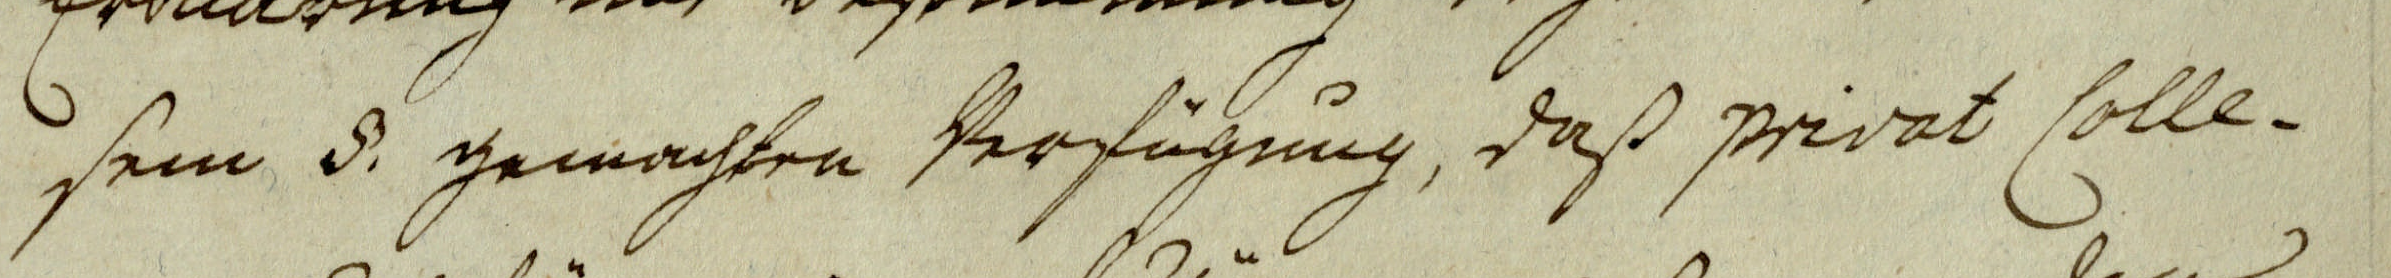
sem §. gemachten Verfügung, daß privat Colle¬
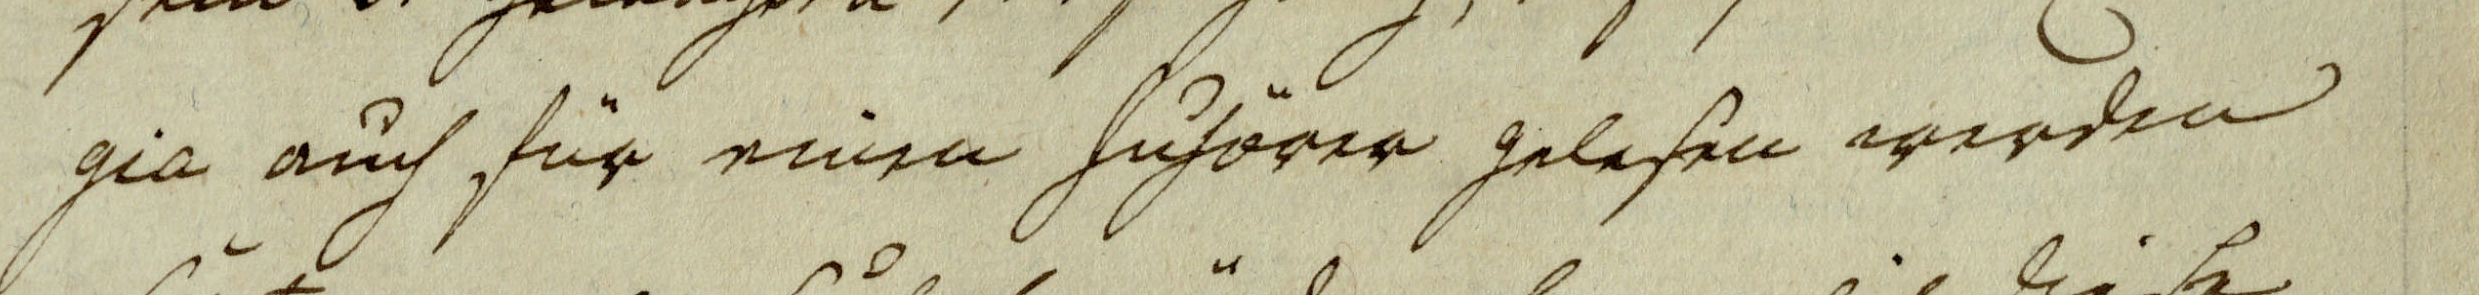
gia auch für einen Zuhörer gelesen werden
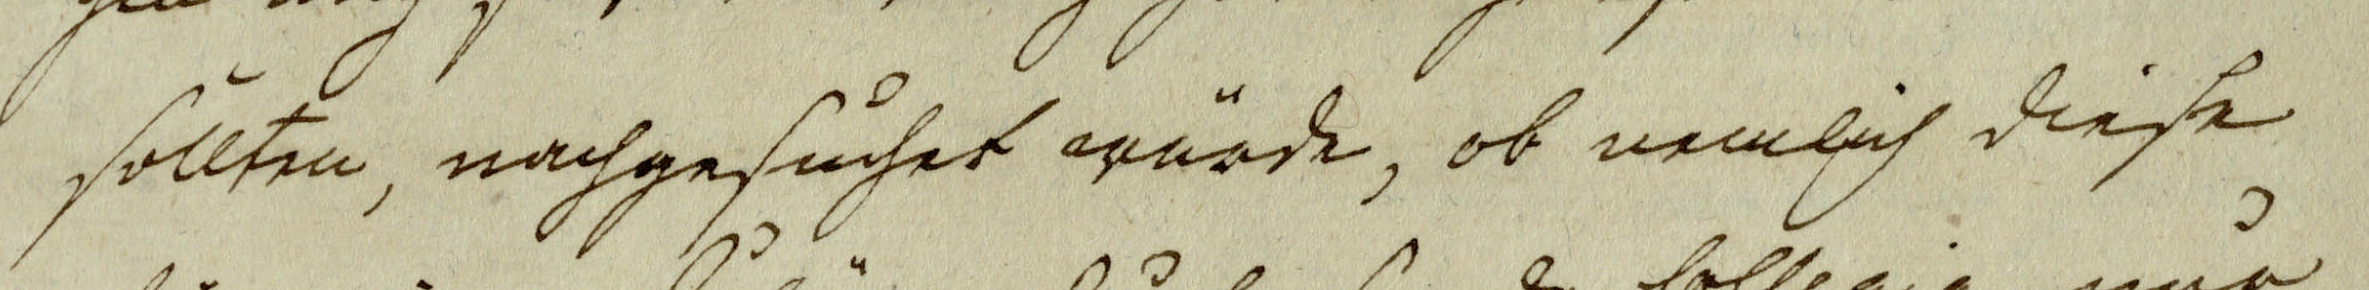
sollten, nachgesuchet würde, ob nemlich diese
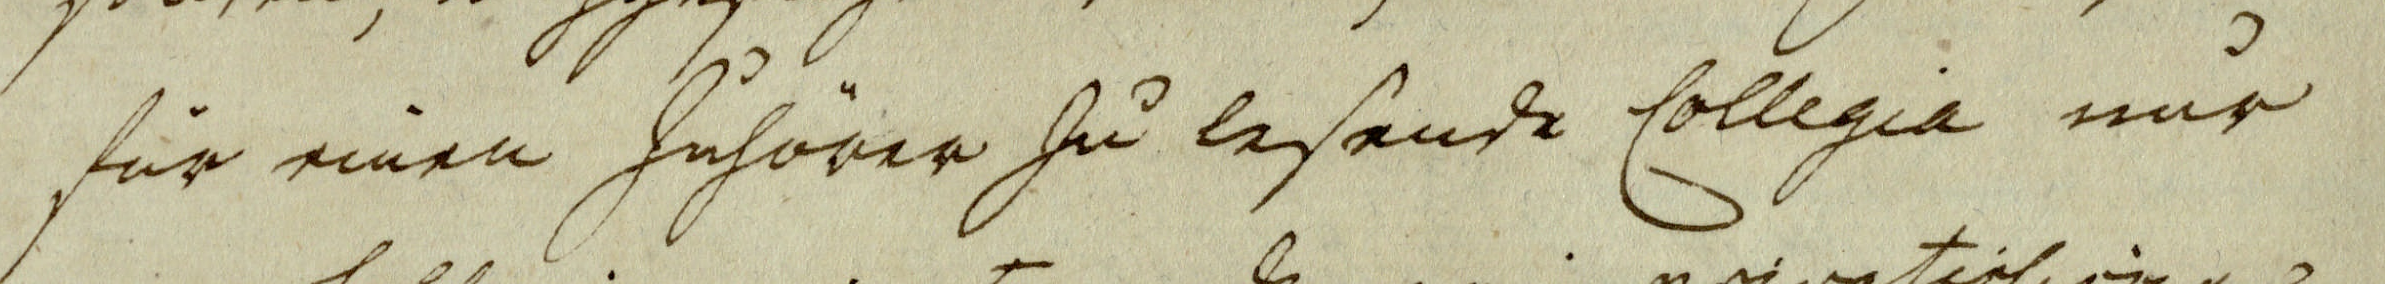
für einen Zuhörer zu lesende Collegia nur
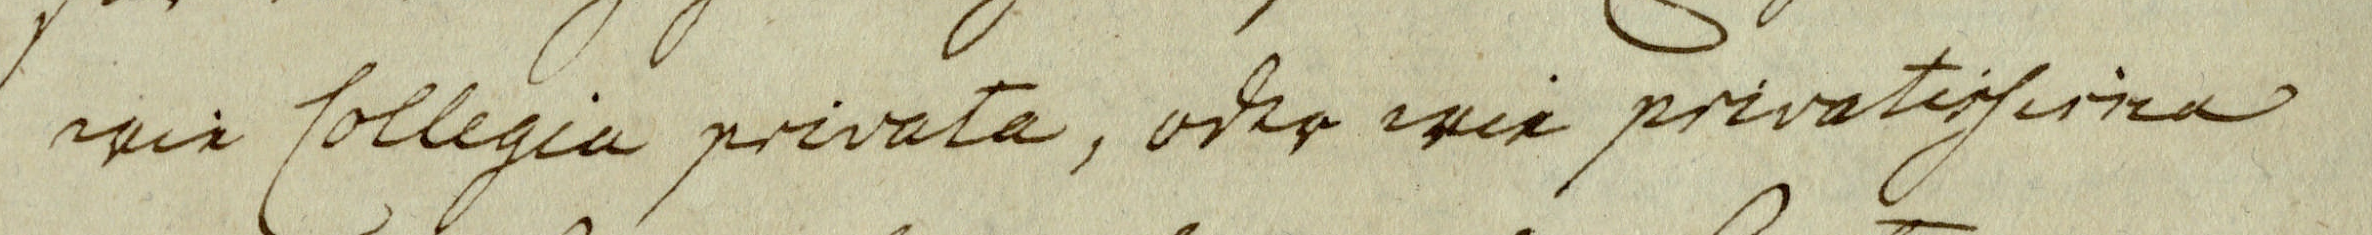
wie Collegia privata, oder wie privatissima
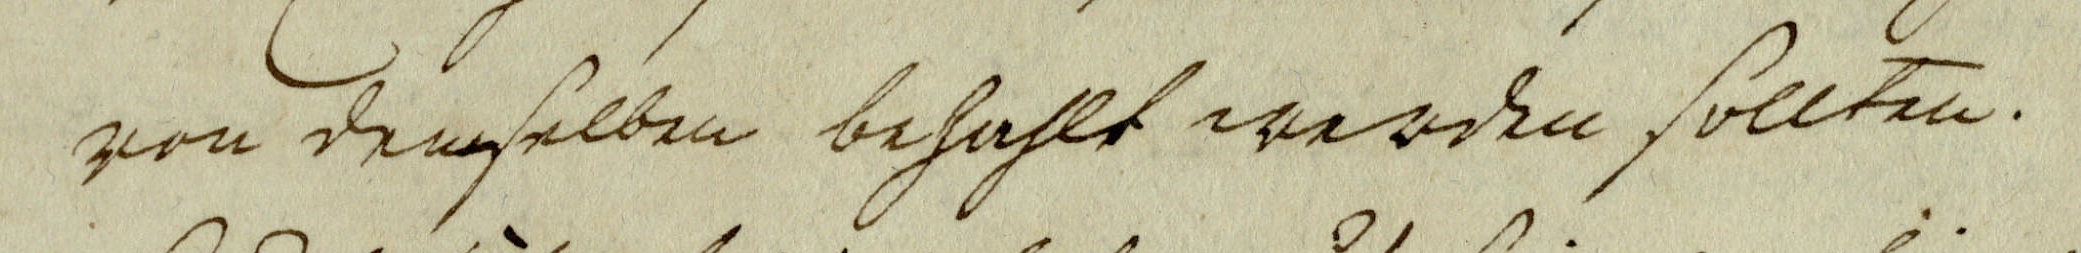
von demselben bezahlt werden sollten.
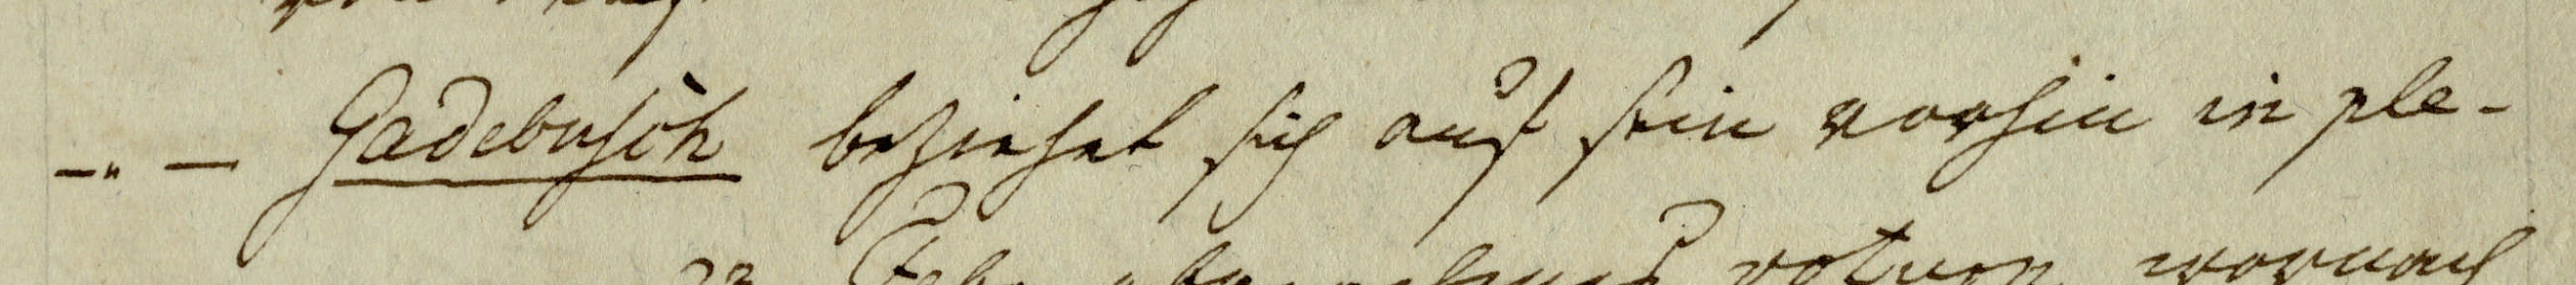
Gadebusch beziehet sich auf sein vorhin in ple¬
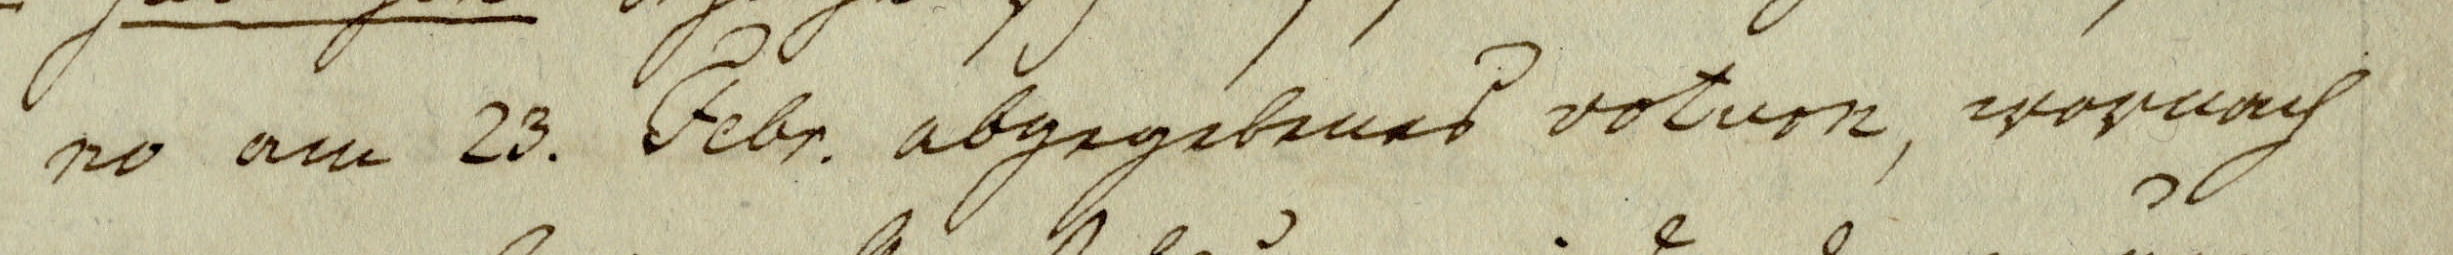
no am 23. Febr. abgegebenes votum, wornach
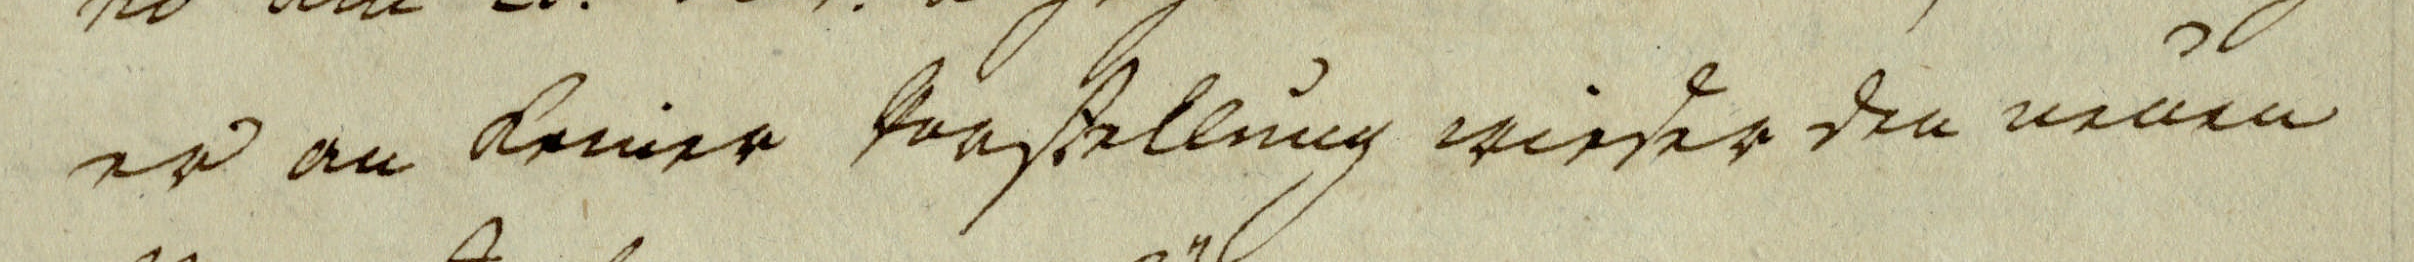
er an keiner Vorstellung wieder den neuen
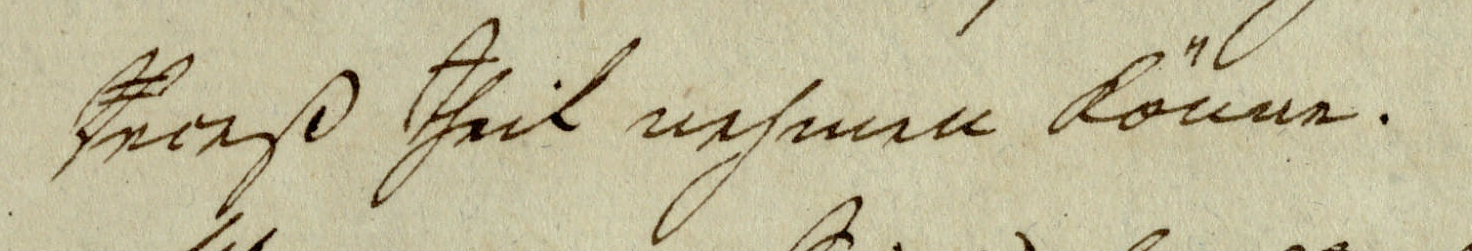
Receß Theil nehmen könne.
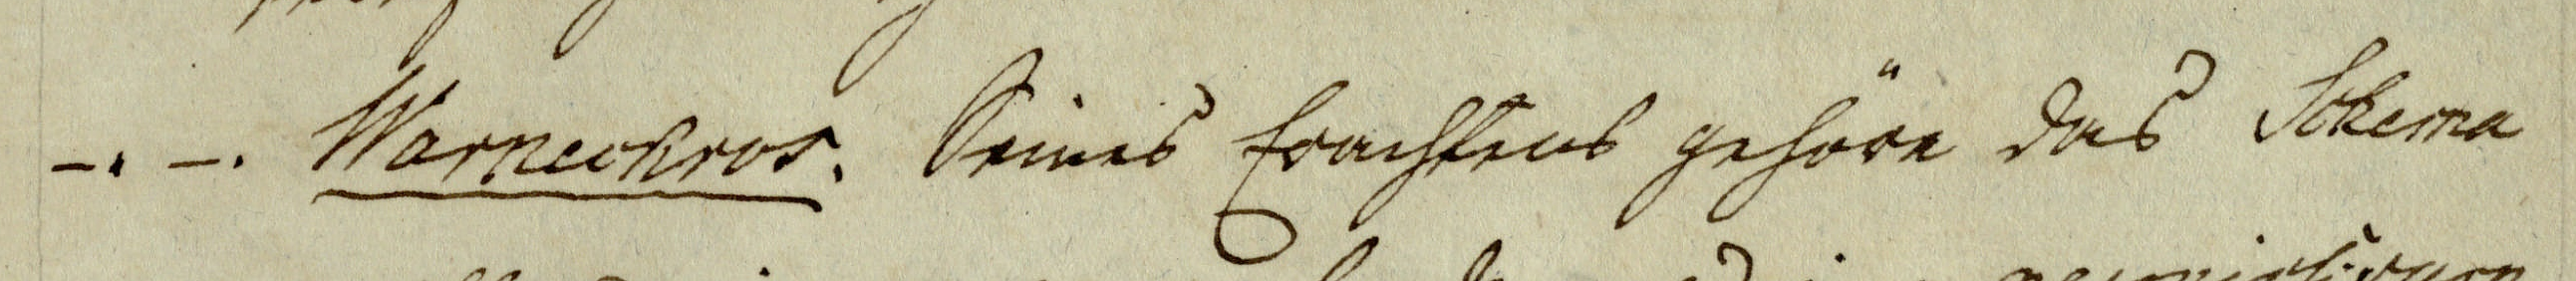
Warneckros. Seines Erachtens gehöre das Schema
